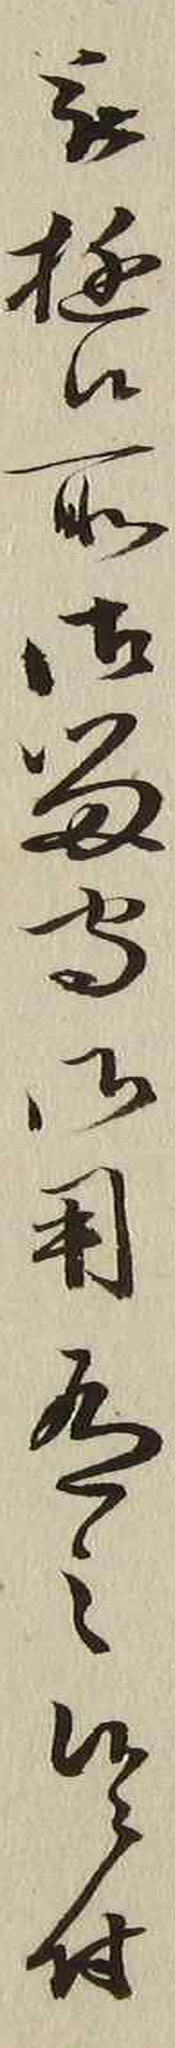被遊候所御留守御用有之候ニ付
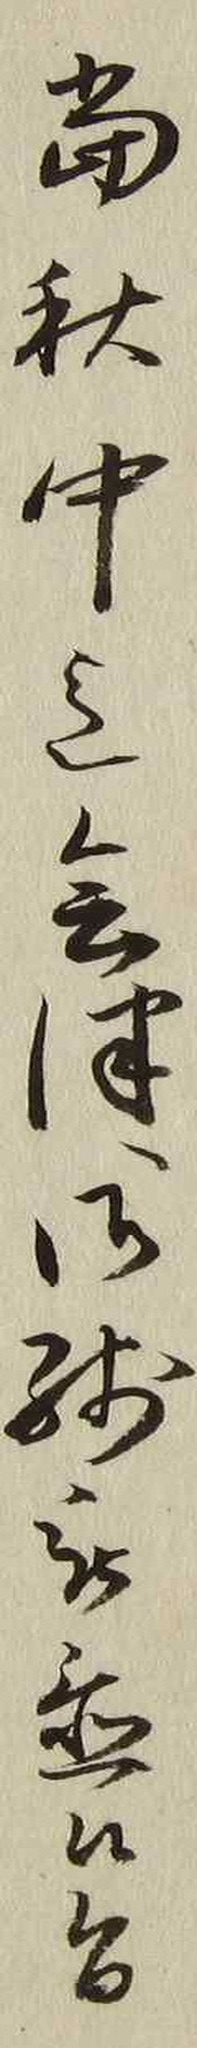当秋中迄会津へ御残被置候旨
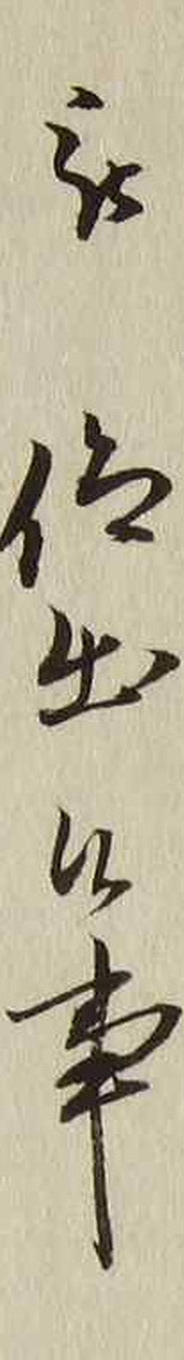被仰出候事
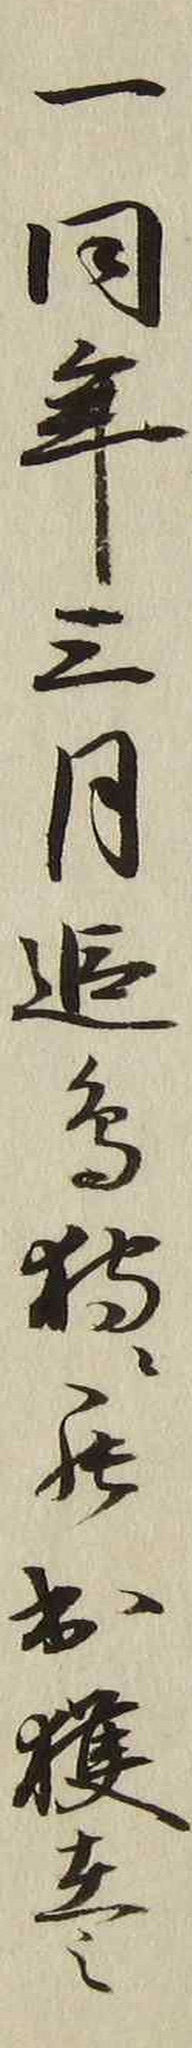一同年三月追鳥狩ニ罷出獲在之
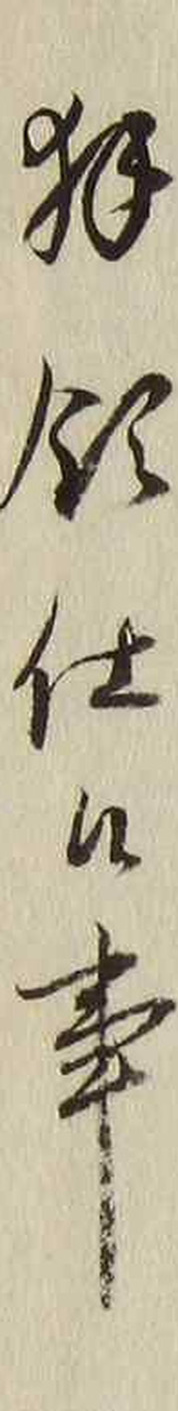拝領仕候事
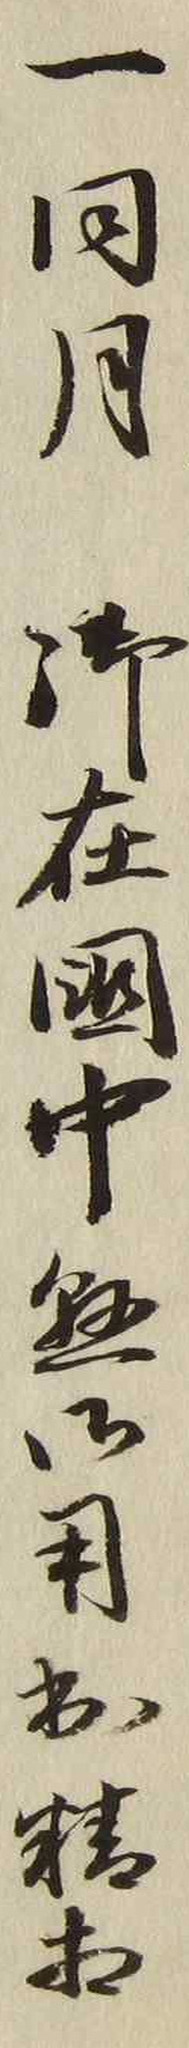一同月御在国中懸御用出精相
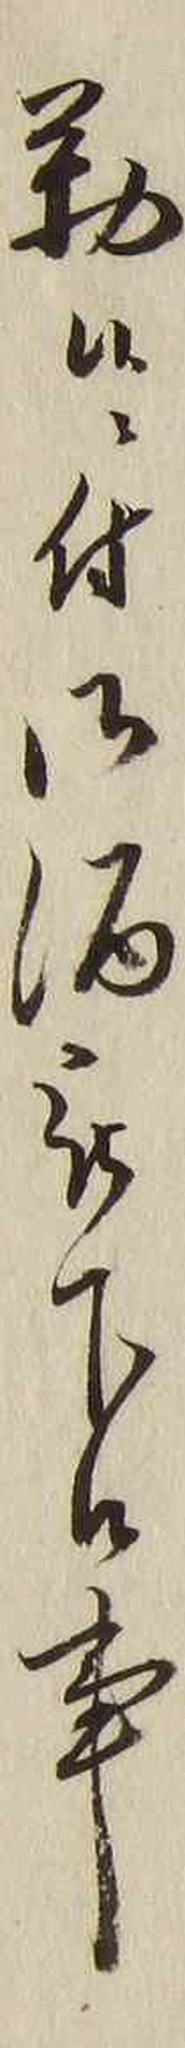勤候ニ付御酒被下候事

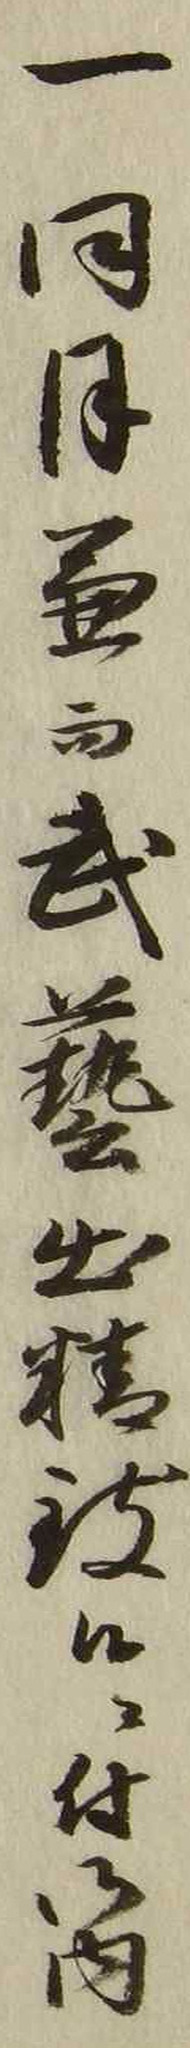一同月兼而武芸出精致候ニ付御内
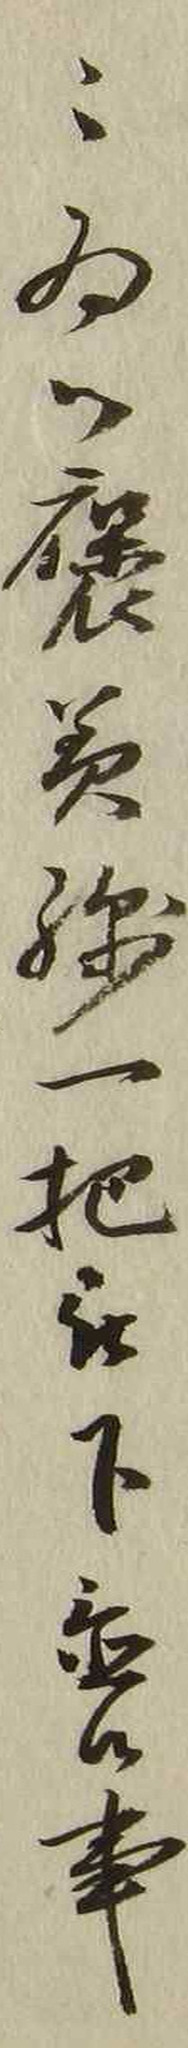々為御褒美綿一把被下置候事
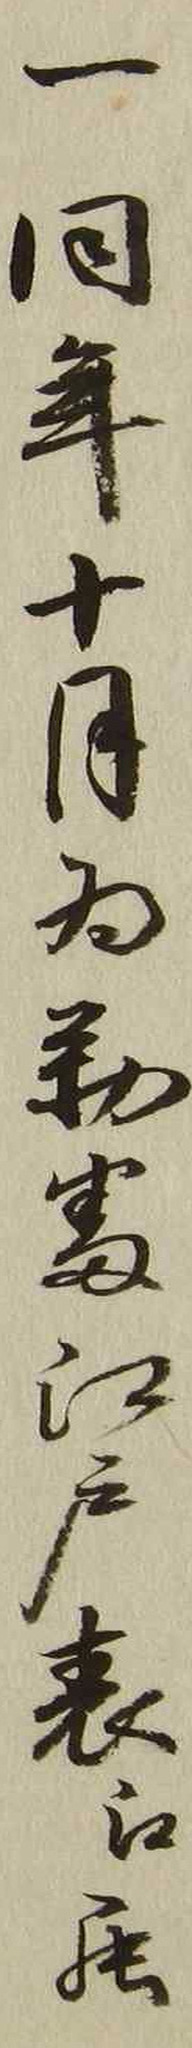一同年十月為勤番江戸表江罷
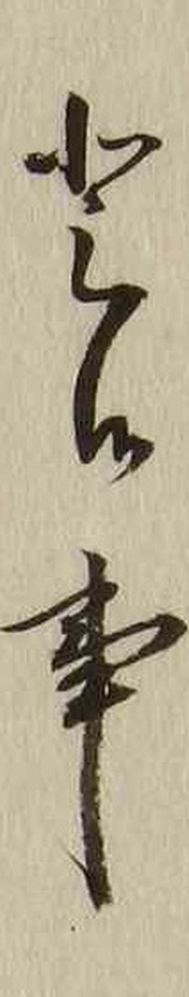登候事
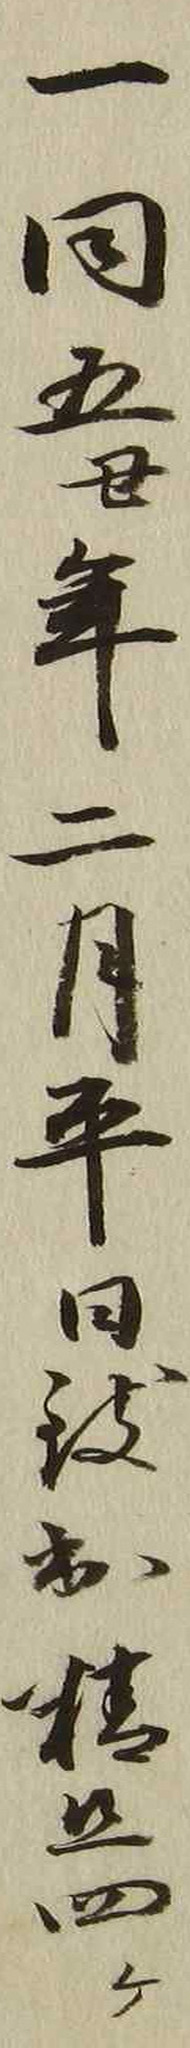一同五丑年二月平日致出精且四ヶ
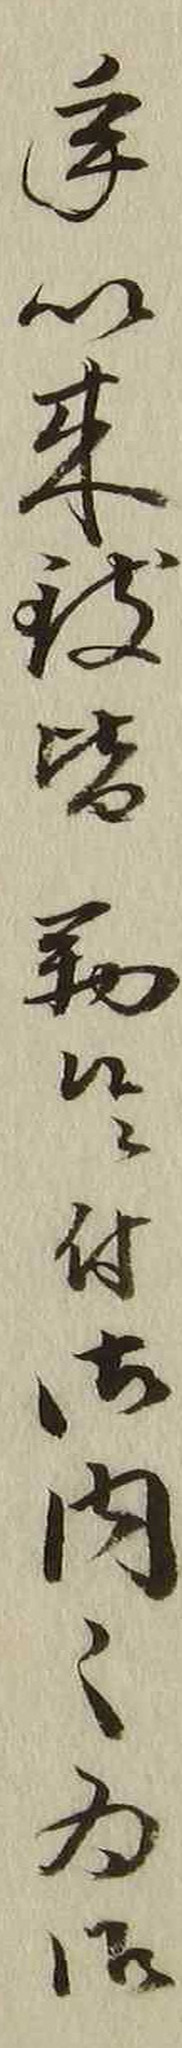年以来致皆勤候ニ付御内々為御
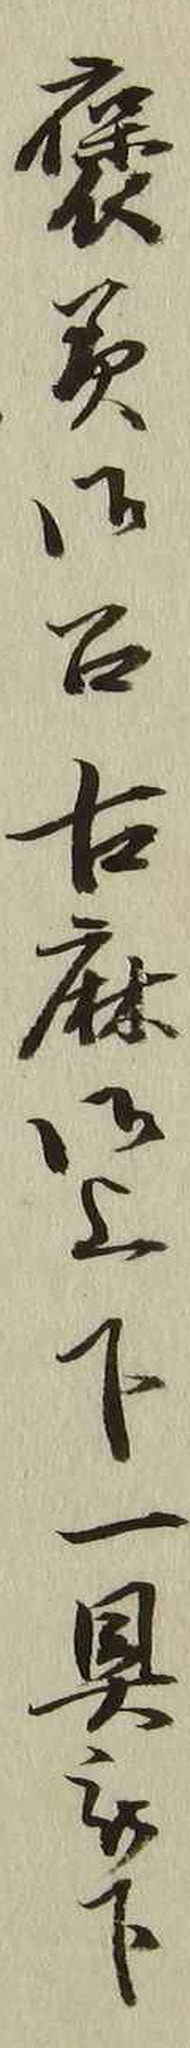褒美御召古麻御上下一具被下
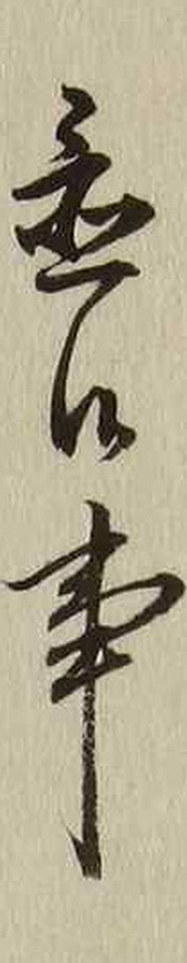置候事
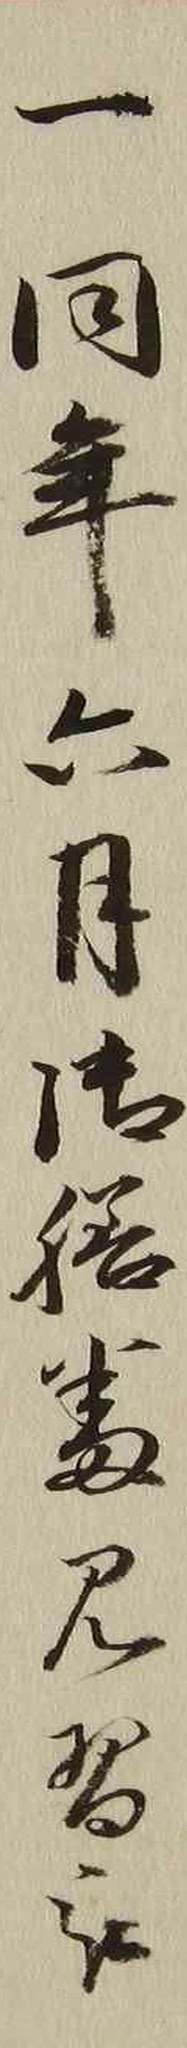一同年六月御膳番見習被
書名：諸士系譜　巻之61　と之部4
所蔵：会津若松市立会津図書館
